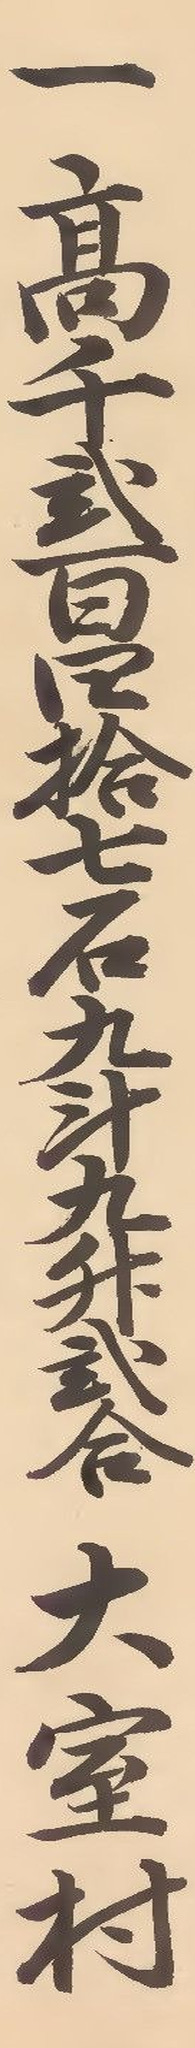一高千弐百四拾七石九斗九升弐合大室村
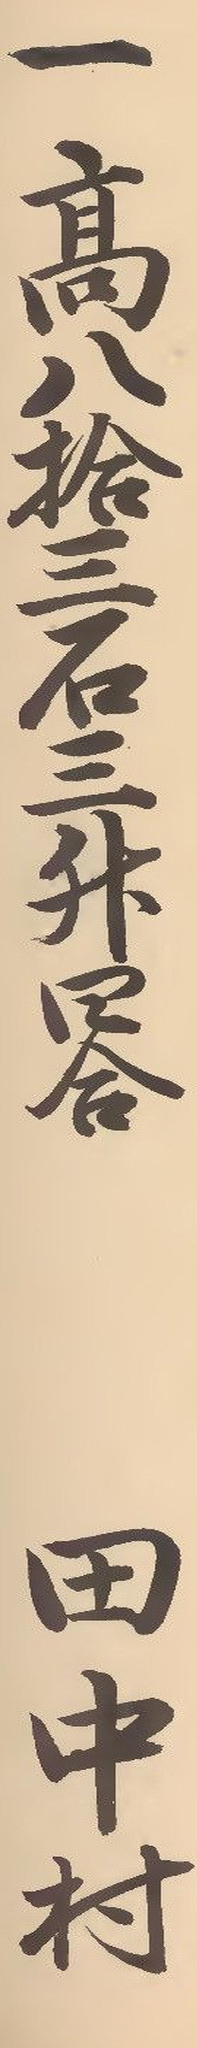一高八拾三石三升四合田中村
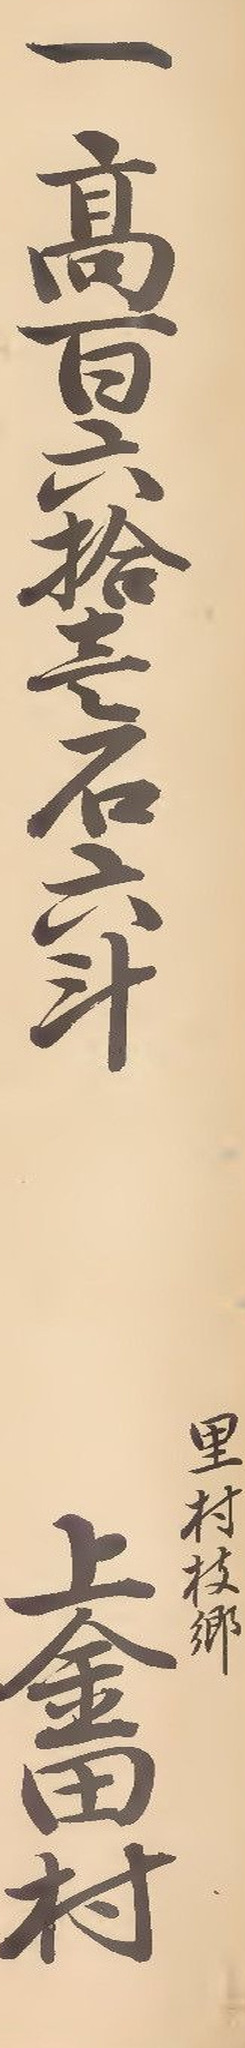一高百六拾壱石六斗上金田村
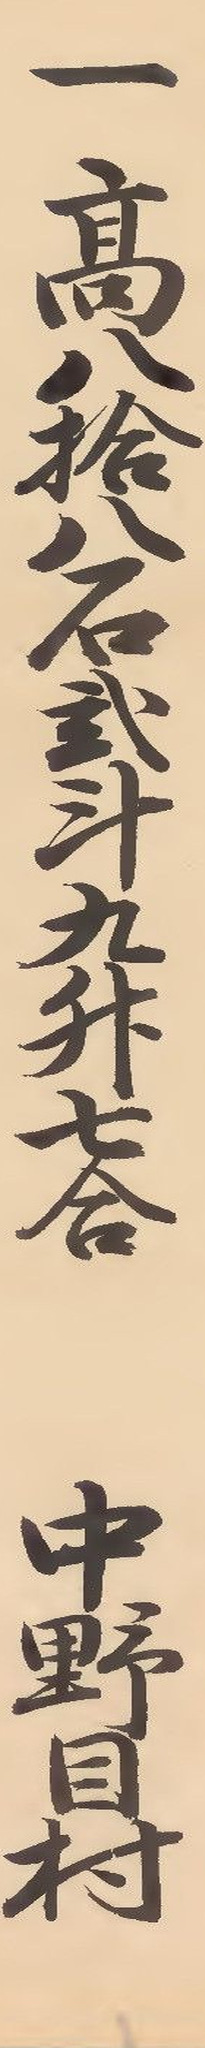一高八拾八石弐斗九升七合中野目村
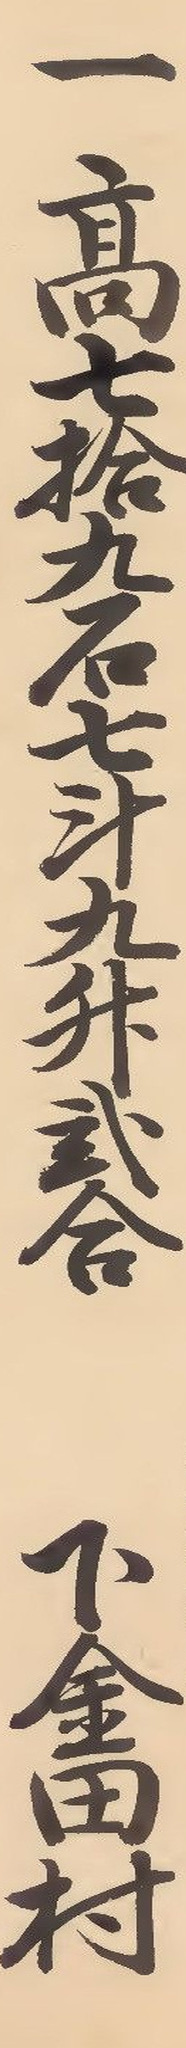一高七拾九石七斗九升弐合下金田村
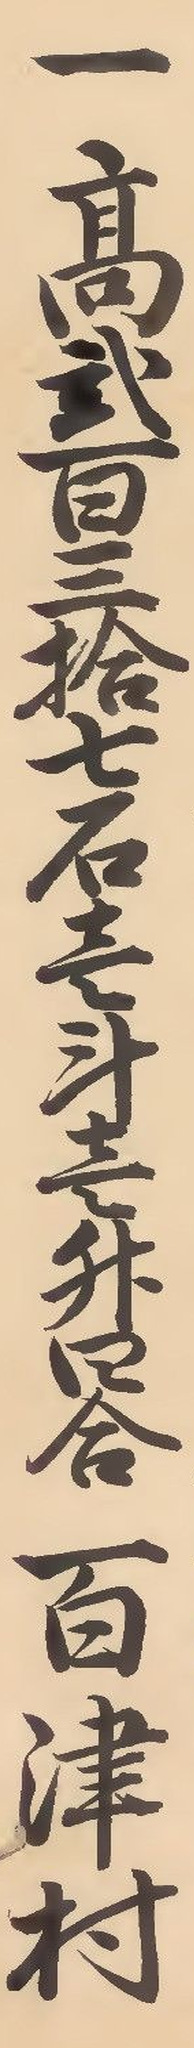一高弐百三拾七石壱斗壱升四合百津村

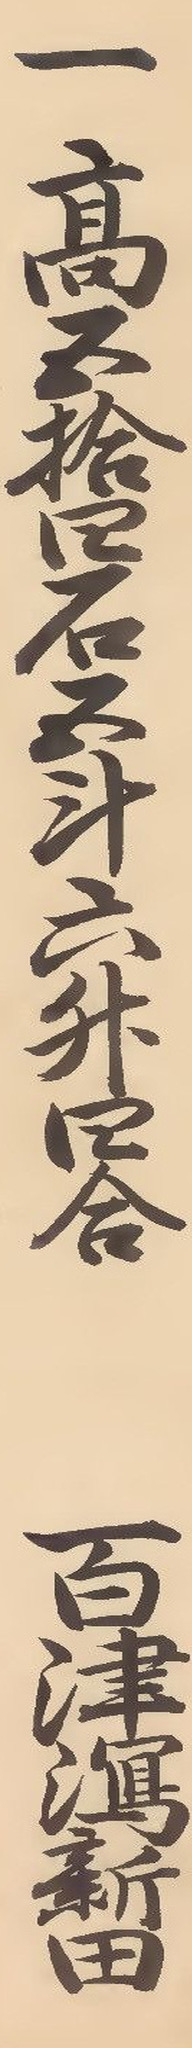一高五拾四石五斗六升四合百津潟新田
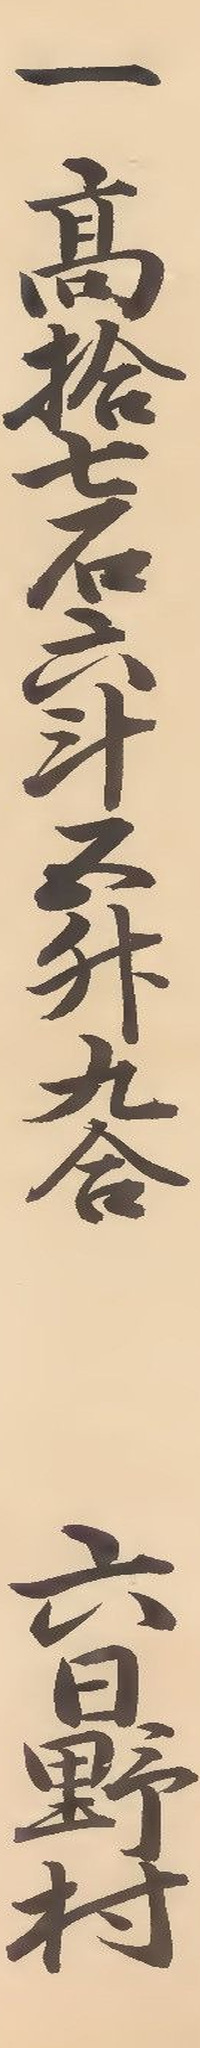一高拾七石六斗五升九合六日野村
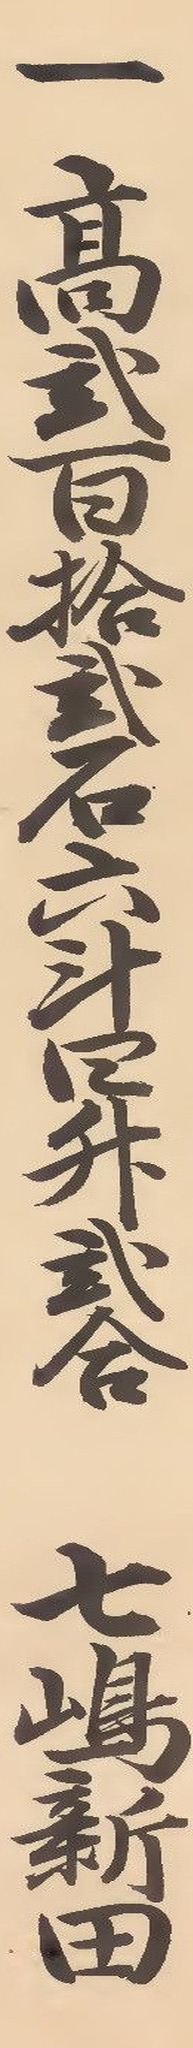一高弐百拾弐石六斗四升弐合七島新田
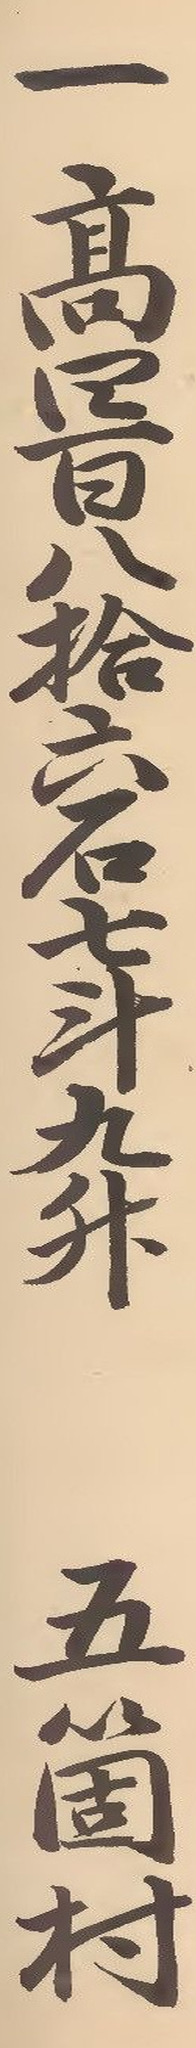一高四百八拾六石七斗九升五箇村
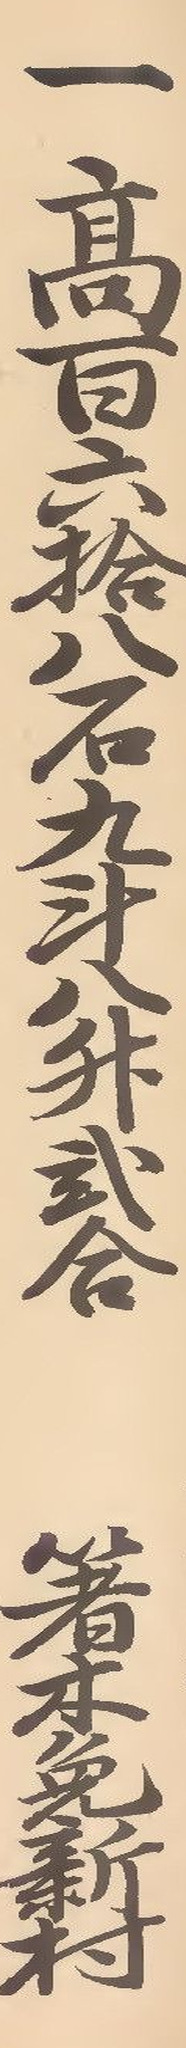一高百六拾八石九斗八升弐合箸木免新村
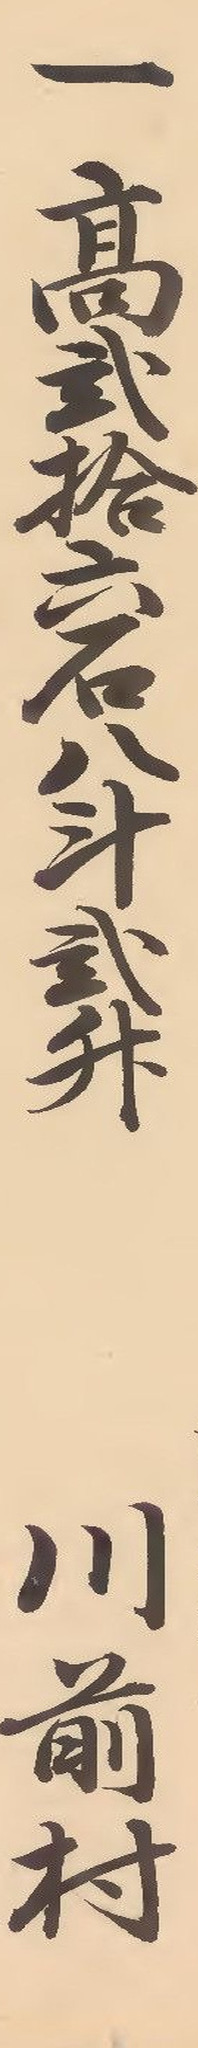一高弐拾六石八斗弐升川前村
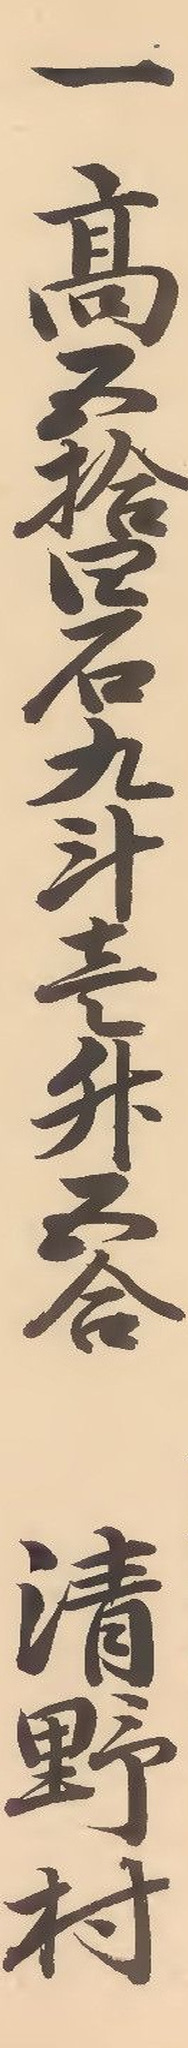一高五拾四石九斗壱升五合清野村
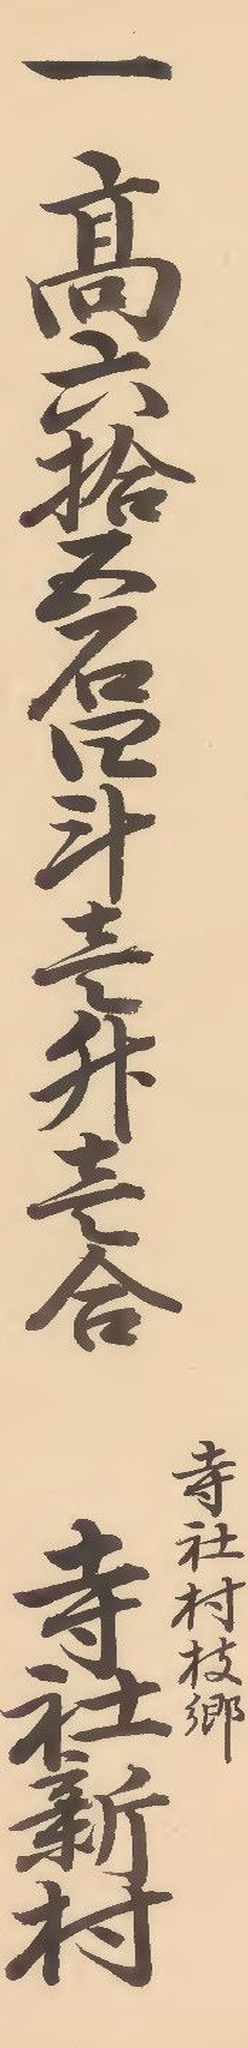一高六拾五石四斗壱升壱合寺社新村

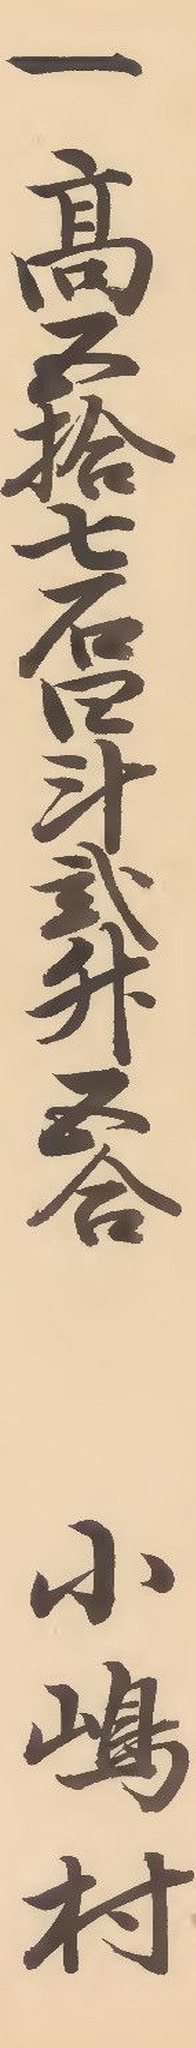一高五拾七石四斗弐升五合小島村
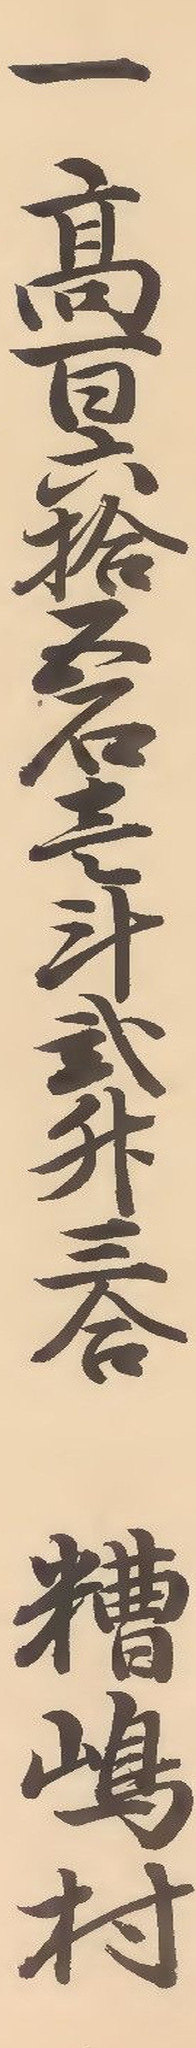一高百六拾五石壱斗弐升三合糟島村
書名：越後国郷帳　下
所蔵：国立公文書館 National Archives of Japan
